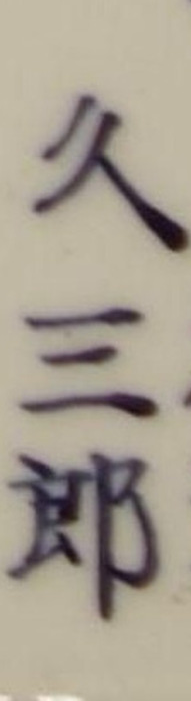久三郎
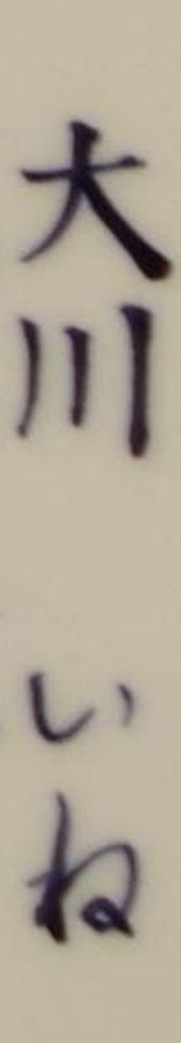大川いね
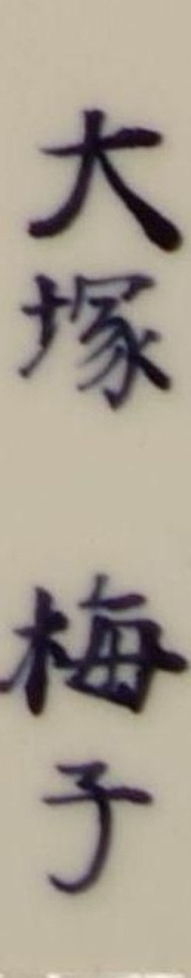大塚梅子
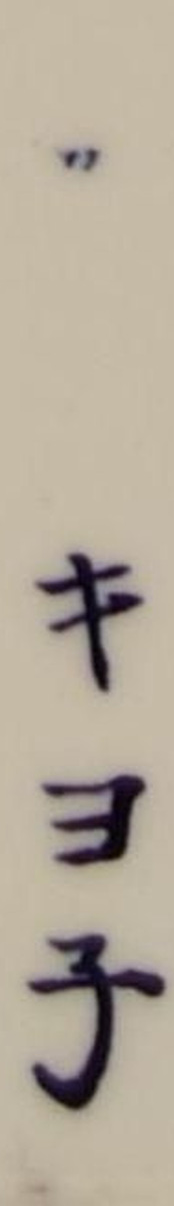キヨ子
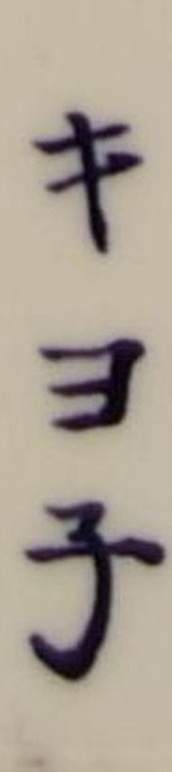キヨ子
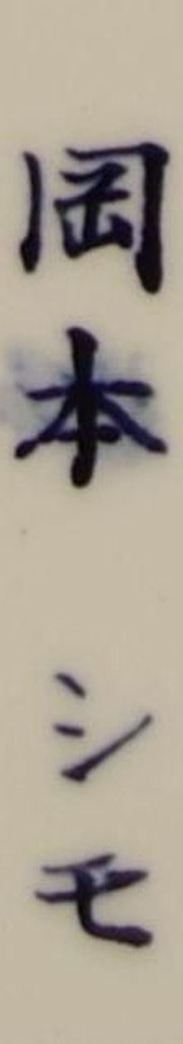岡本シモ
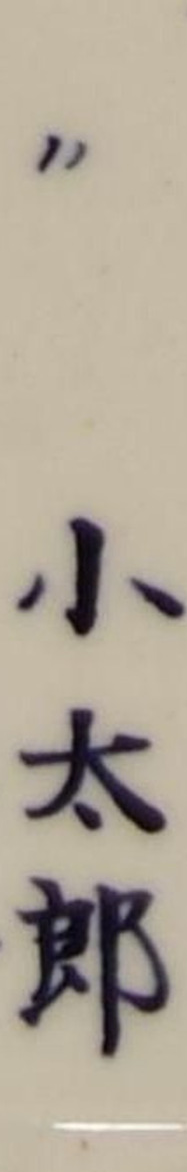小太郎
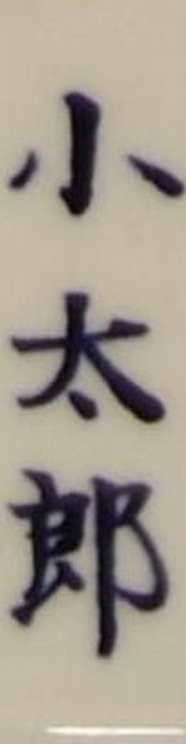小太郎
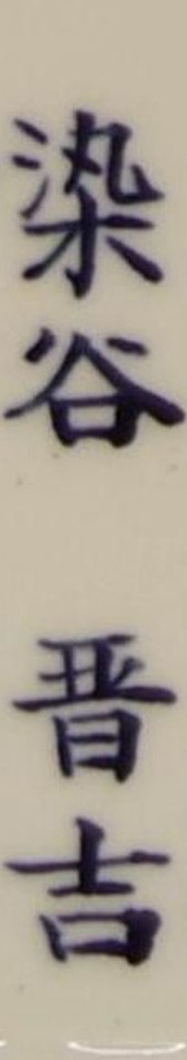染谷晋吉
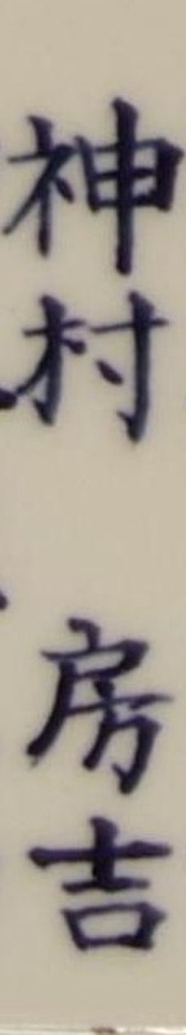神村房吉
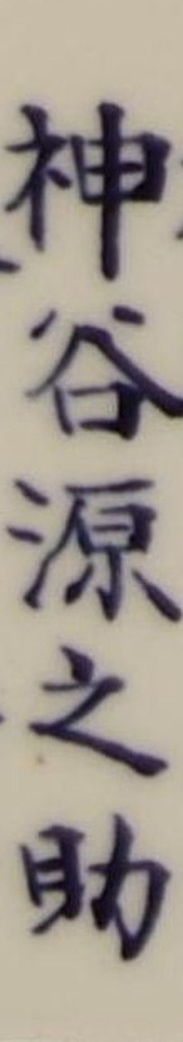神谷源之助
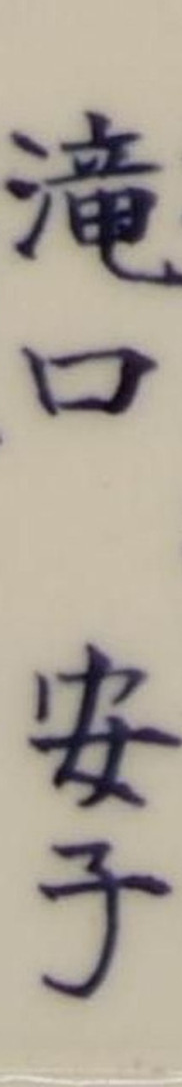滝口安子

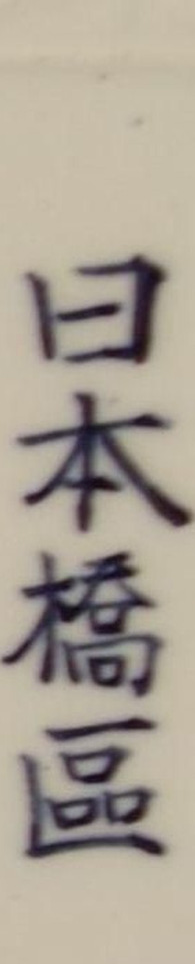＠日本橋区
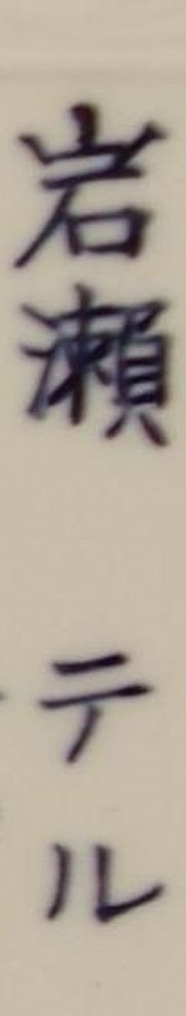岩瀬テル
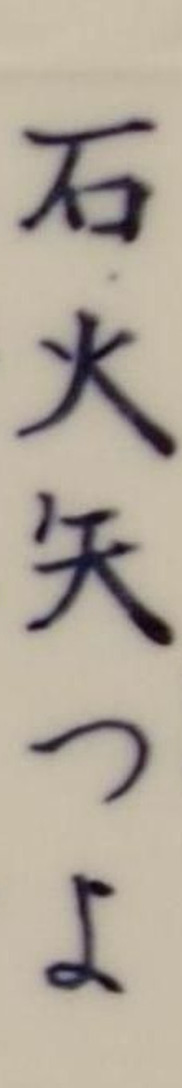石火矢つよ
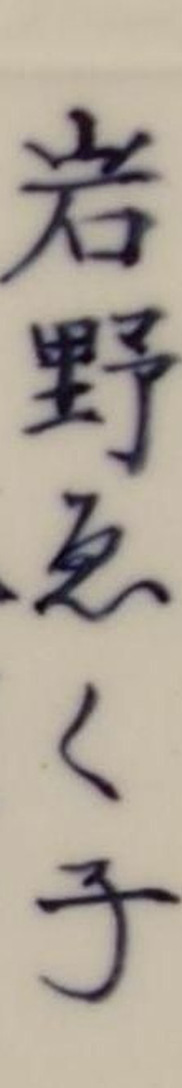岩野えく子
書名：E~L
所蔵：高野山金剛峯寺
